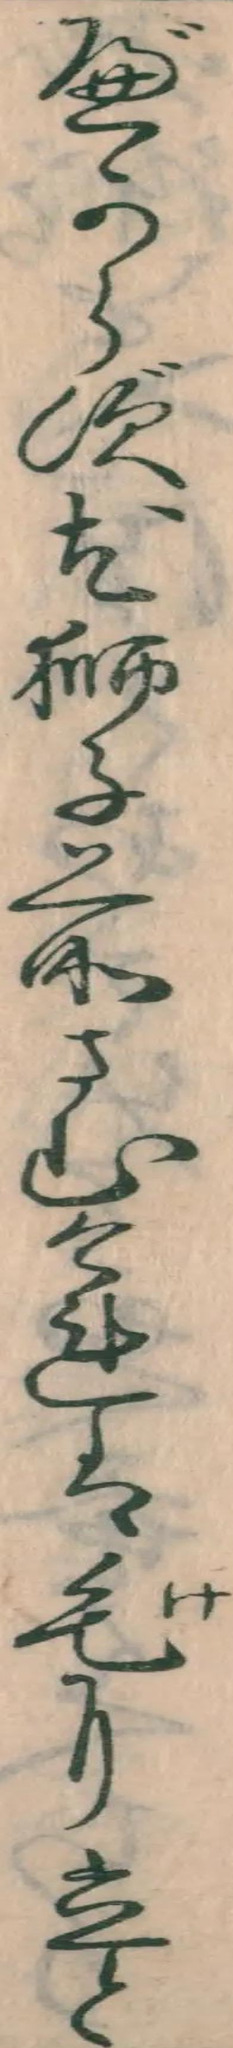べからず尤獅子前さむけれは毛に立と
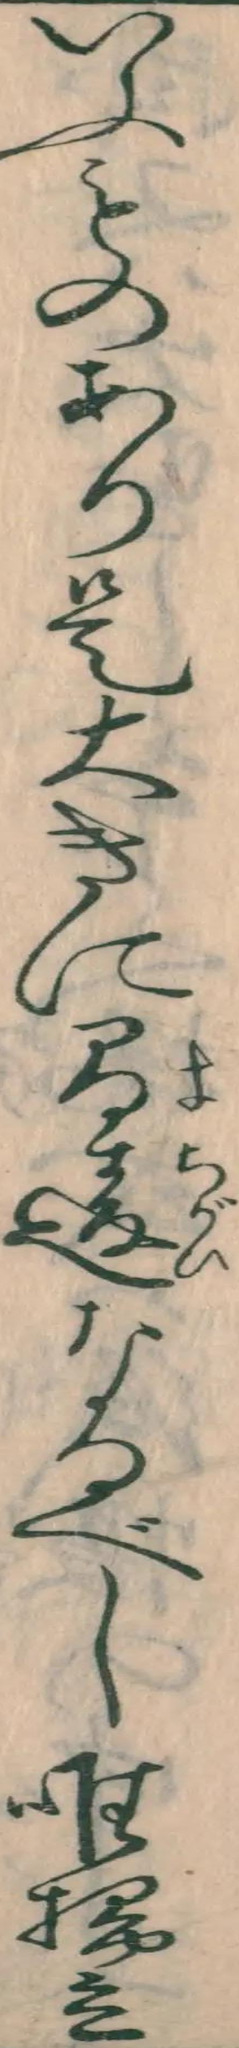いふものあり是大きに間違なるべし唯掃立
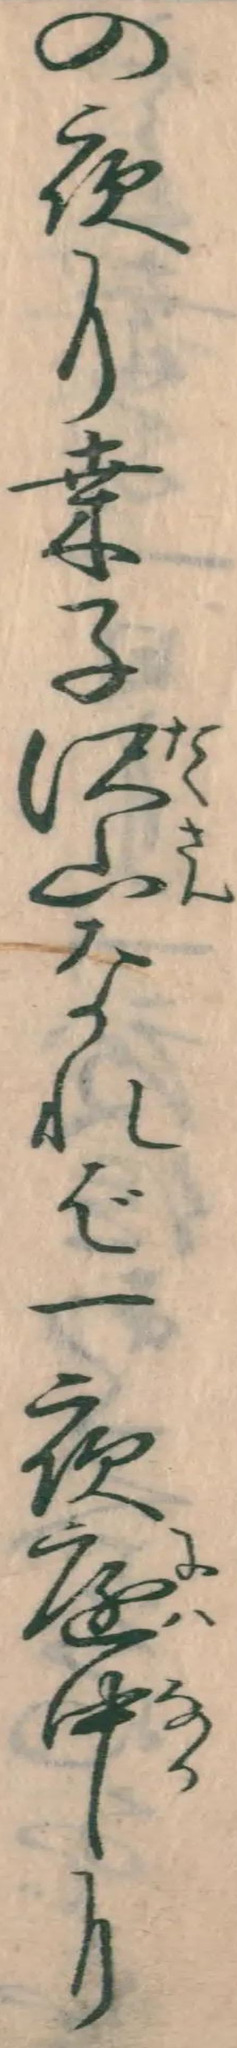の夜に桑子沢山なれば一夜庭中に
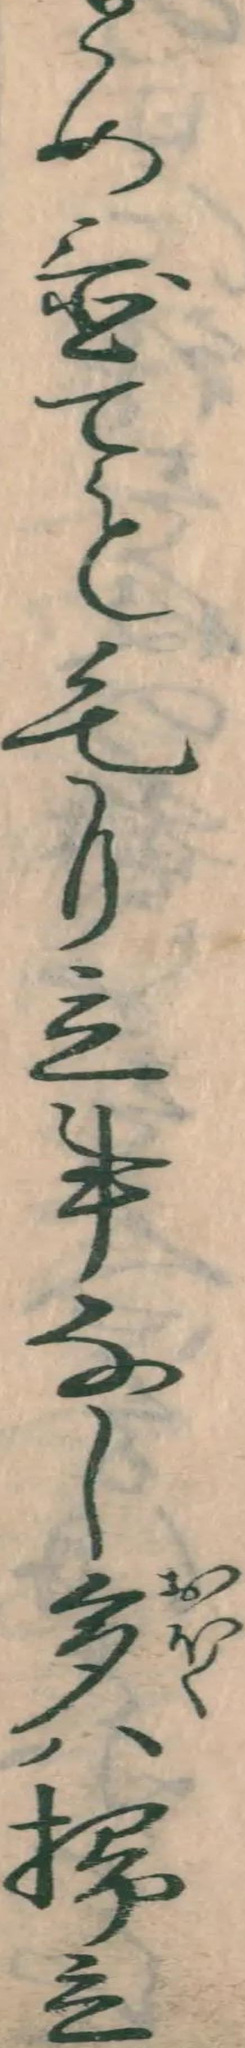とめ置ても毛に立事なし多は掃立

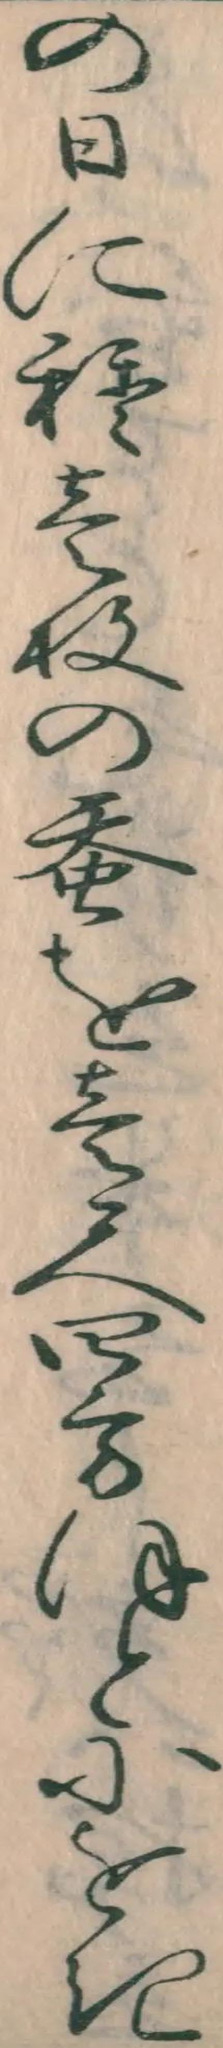の日に種壱枚の蚕を壱尺四方ほとにをき
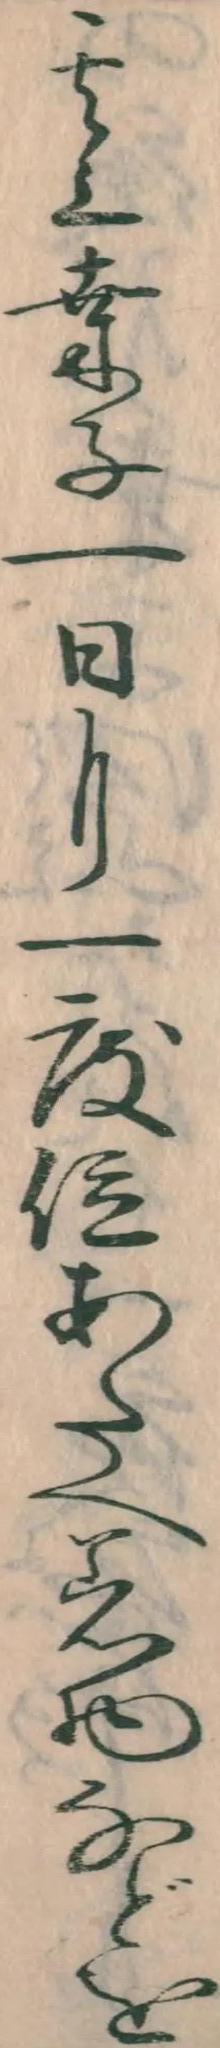其上桑子一日に一度位あたへ着物などを
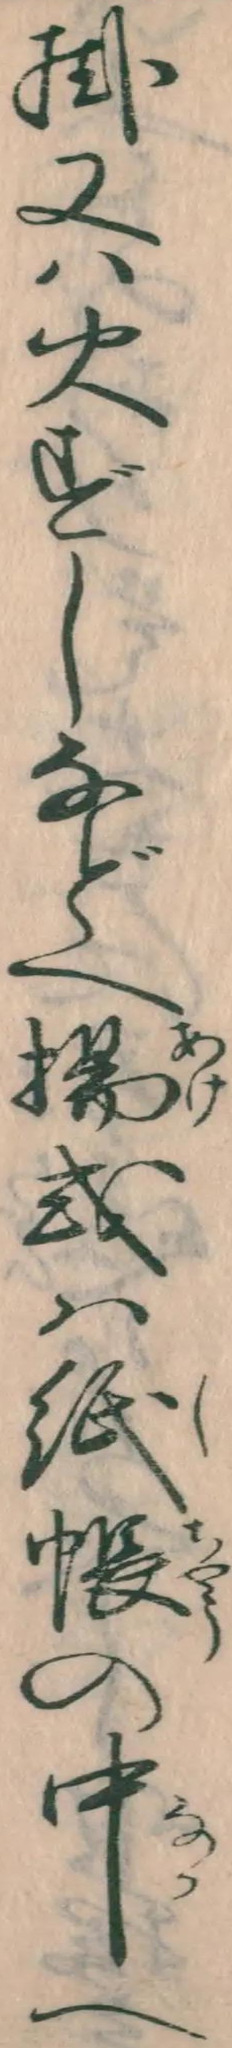掛又は火ずしなどへ揚或は紙帳の中へ
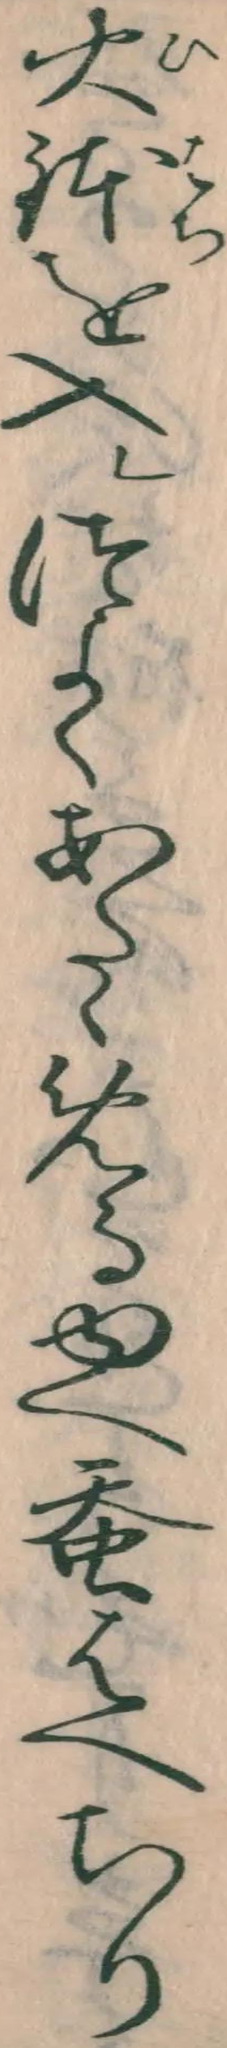火鉢を入れつよくあたゝめるゆへ蚕はへちり
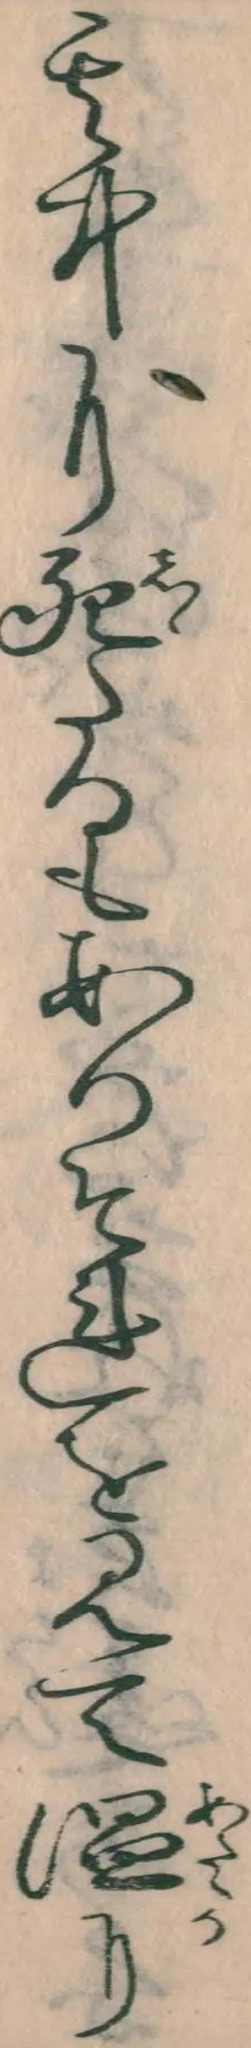其中に死たるもありそれを見て温に
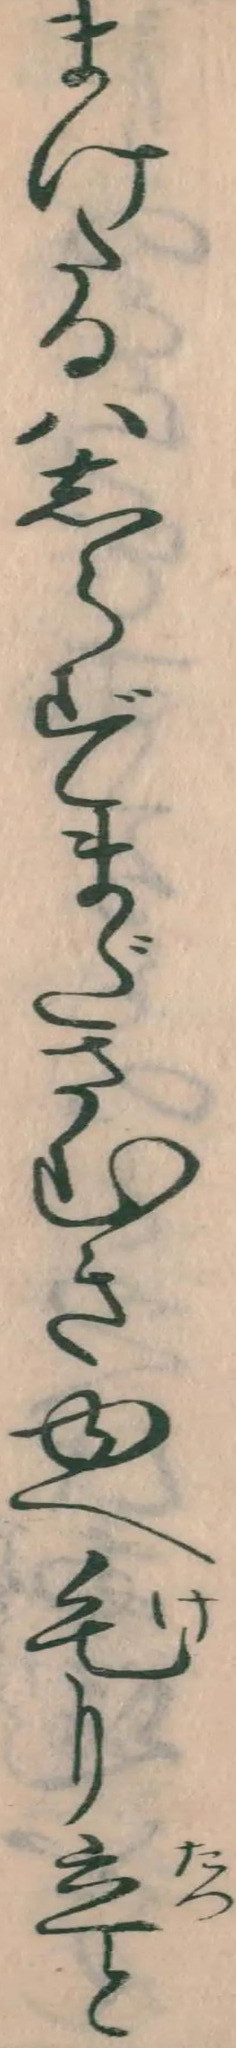まけたるはしらずまださむきゆへ毛に立と
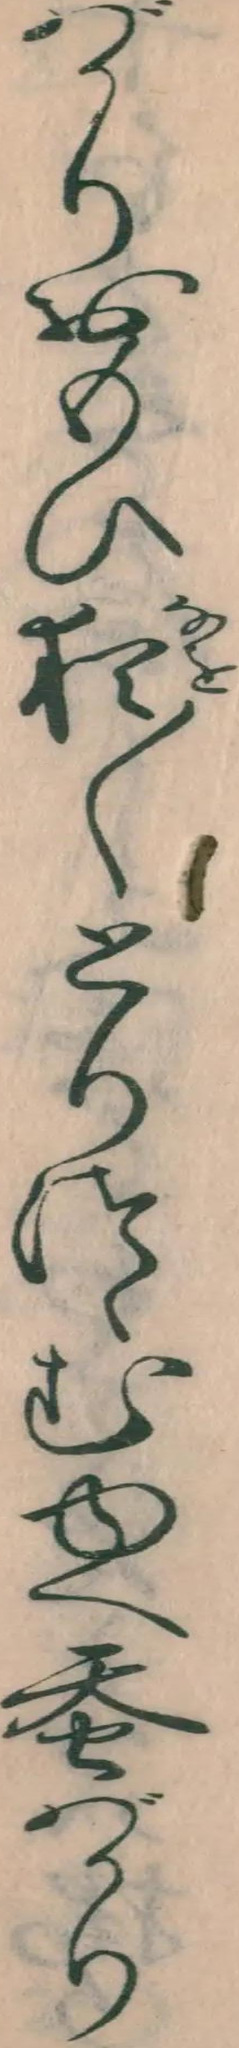ばかりおもひ猶〳〵とりつゝむゆへ蚕ばかり
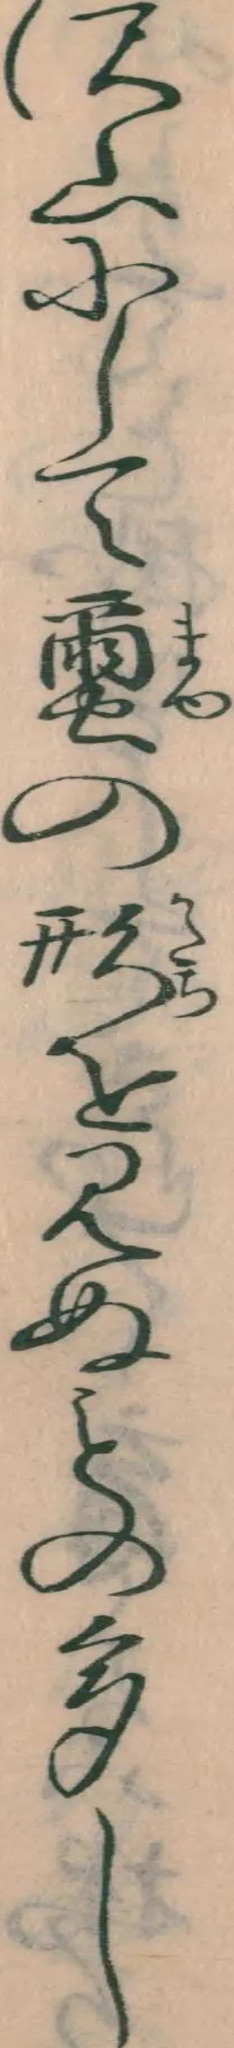沢山にして繭の形を見ぬもの多し
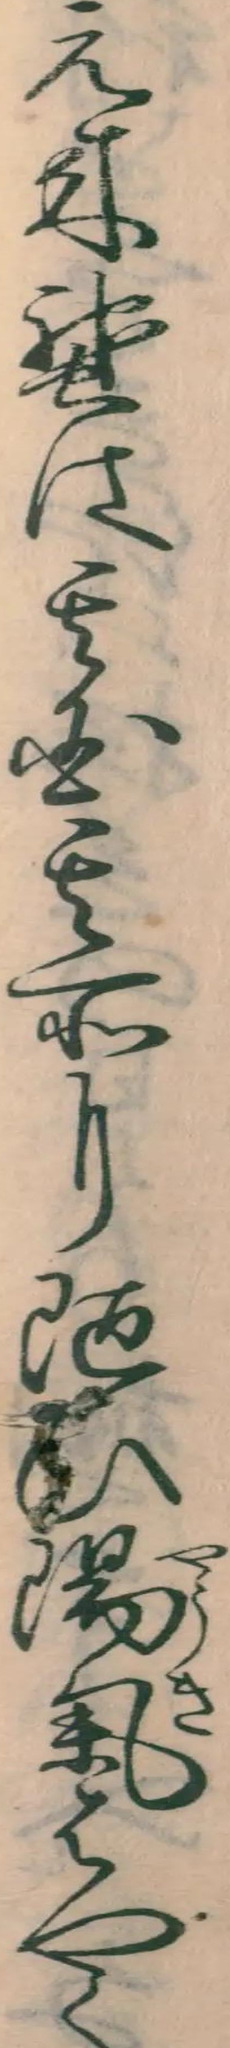元来䗝は其国其所に随ひ陽気はやく
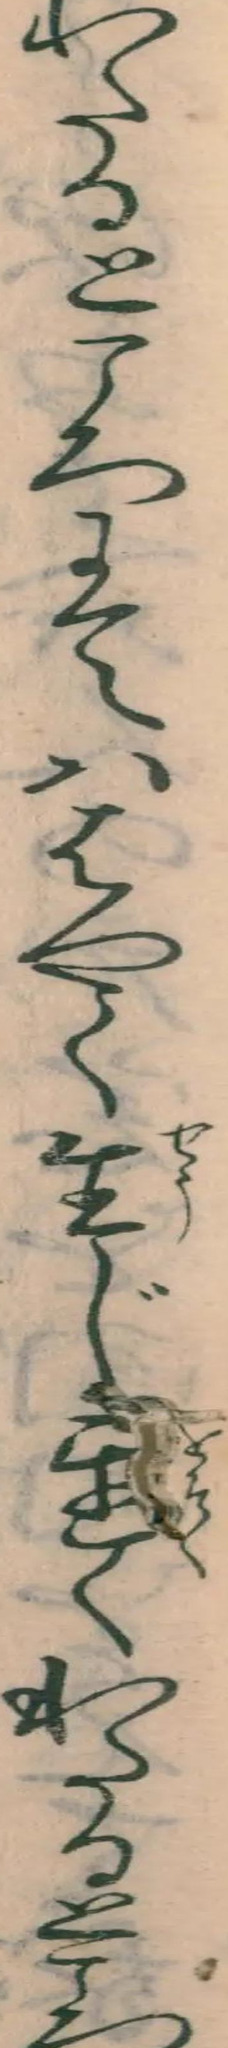わたるところにてはははやく生じ遅くわたるところ
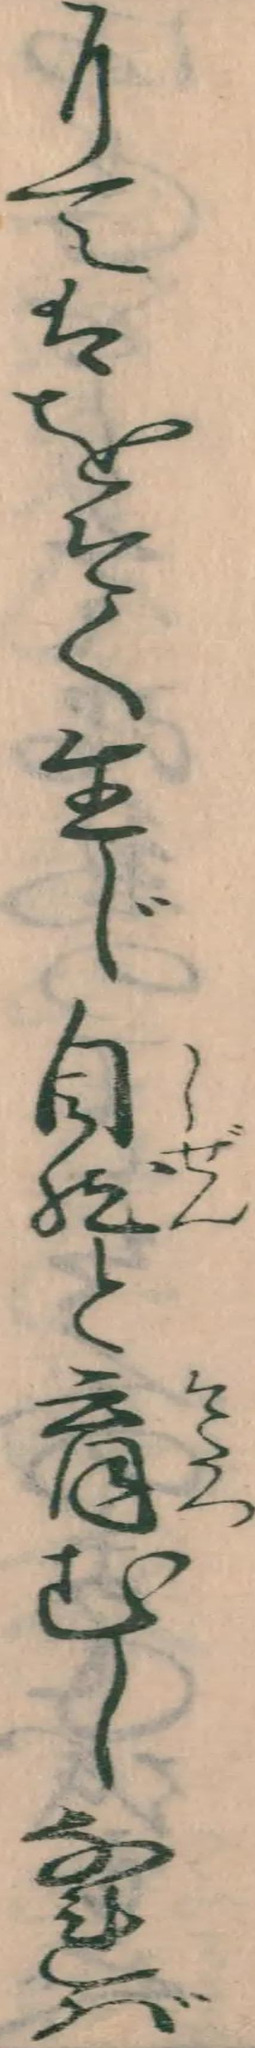にてはをそく生じ自然と育むしなれば
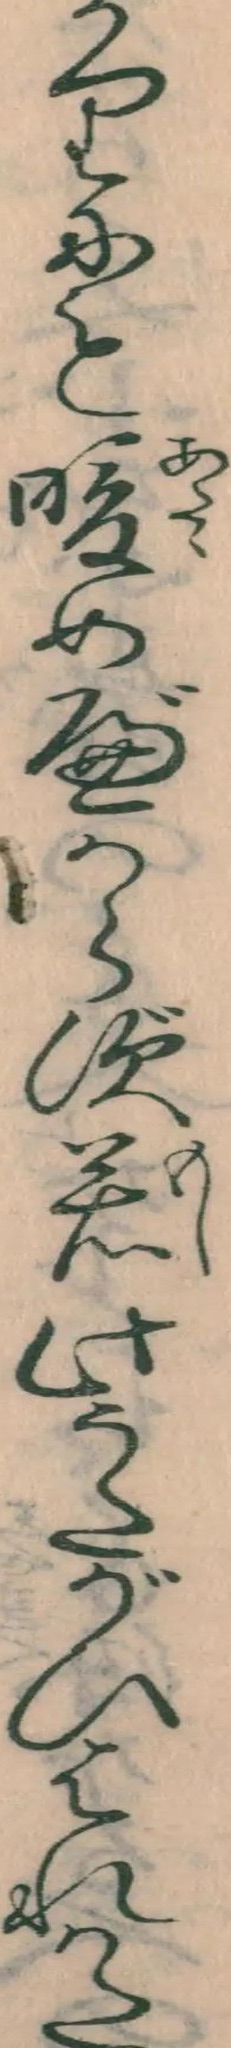かりにも暖めべからず若此うたがひはれかた
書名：新撰養蚕秘書
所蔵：国立国会図書館 National Diet Library, JAPAN
